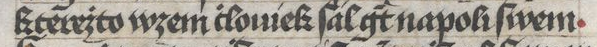ktereżto wzem ċlouiek ſál ḡt napoli ſwem.
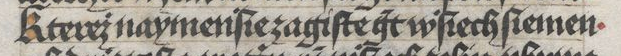Ktereż naymenẛie zagiſte ḡt wẛiech ſiemen.
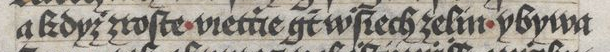a kdyż zroſte.vietċie ḡt wẛiech zelin.y bywa
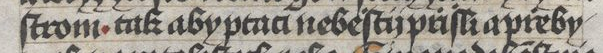ſtrom.tak aby ptaci nebeẛtij pṙiẛli a pṙeby¬
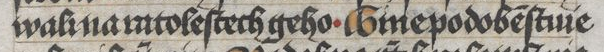wali na ratoleſtech geho.Gine podobēſtuíe
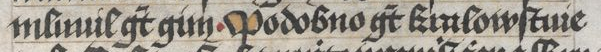mluuil ḡt gim.Podobno ḡt kralowſtuie
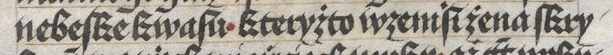nebeſke kwaſu.kteryżto wzemẛi żena ſkry¬
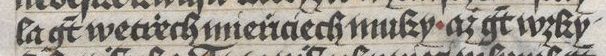la ḡt wetṙech mieṙicíech muky.aż ḡt wzky¬
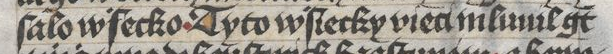ſalo wẛecko.Tyto wẛiecky vieci mluuil ḡt
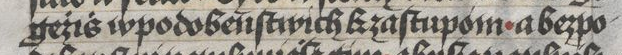geżiṡ wpodobenſtwich kzaſtupóm.a bezpo¬
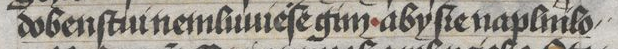dobenſtuí nemluuíeẛe gím.aby ſie naplnilo
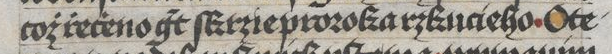coż ṙeċeno ḡt ſkrzie proroka rzkucíeho.Ote¬
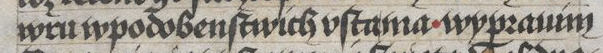wru wpodobenſtvích vſtama.wyprauím
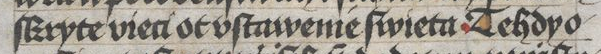ſkryte vieci ot vſtawenie ſwieta.Tehdy o¬
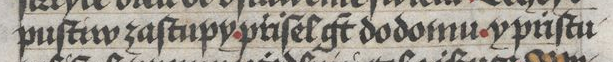puſtiw zaſtupy.pṙiẛel ḡt do domu.y pṙiſtu¬
